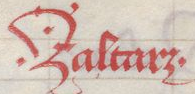.Żaltarz.
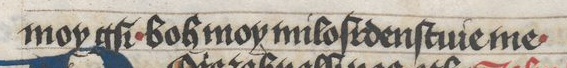moy gſi.boh moy miloſrdenſtuie me.
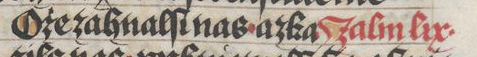Oże zahnalſi nas.a zka.Zalm lix.
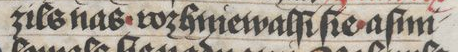zils nas.rozhniewalſi ſie.aſmí¬
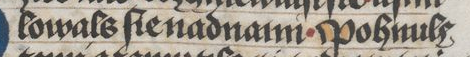lowals ſie nadnami.Pohnuls
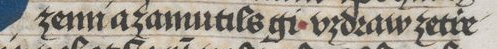zemí a zamutils gi.vzdraw zetṙe¬
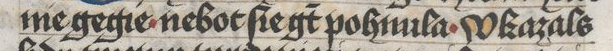nie gegíe.nebot ſie ḡt pohnula.Vkazals
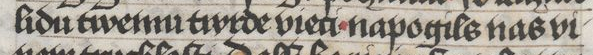lidu twemu twrde vieci.napogils nas vi¬
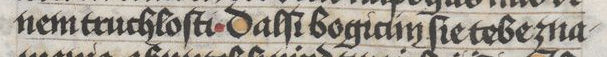nem truchloſti.Dalſi bogicím ſie tebe zna¬
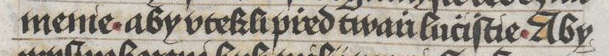menie.aby vtekli pṙed twaṙi luċiẛtie.Aby
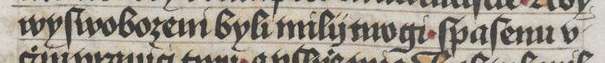wyſwobozeni byli milij twogi.ſpaſenu v¬
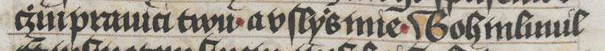cżini prauici twu.a vſlyṡ mie.Boh mluuil
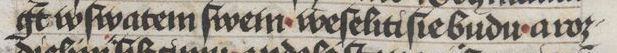ḡt wſwatem ſwem.weſeliti ſie budu.a roz¬
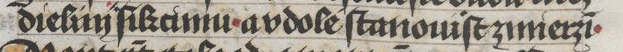dielim ẛikcimu.a v dolé ſtanouiẛt zmierzī.
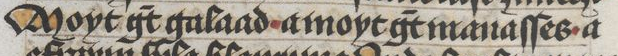Moyt ḡt galaad.a moyt ḡt mana ſſes.a
